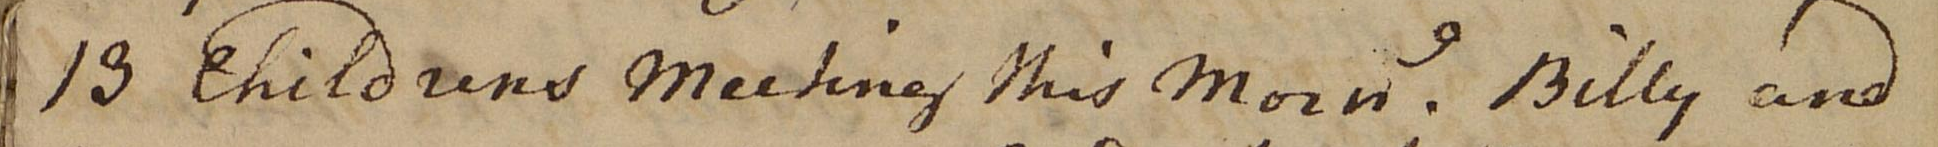13 Childrens Meeting this Morn^g. Billy and
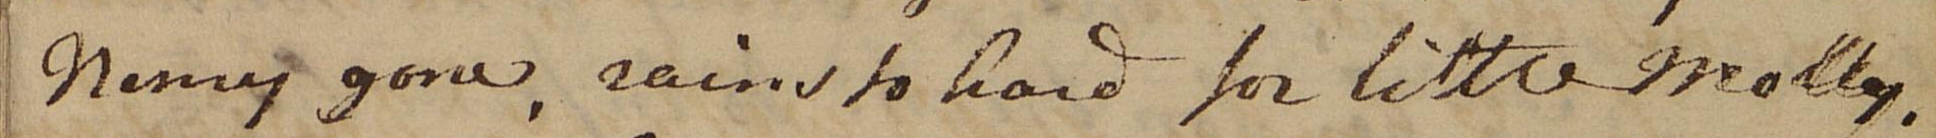Namy gone, rains to hard for little Molly,
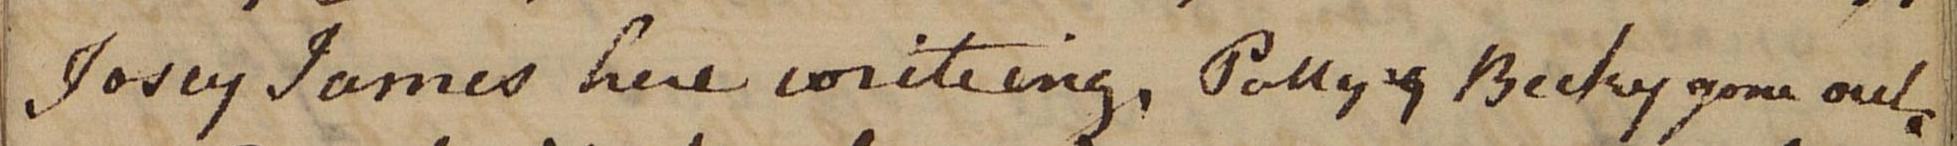Josey James here writeing, Patty & Becky gone out,
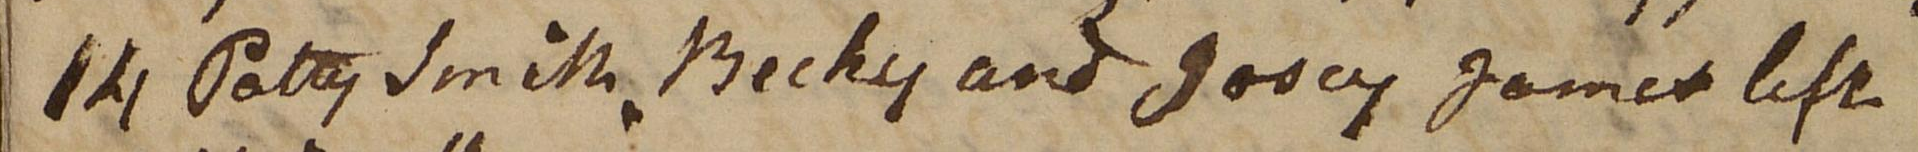14 Patty Smith Becky and Josey James lift
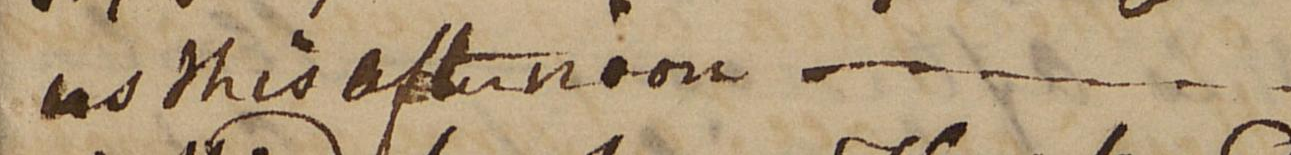us this afternoon-
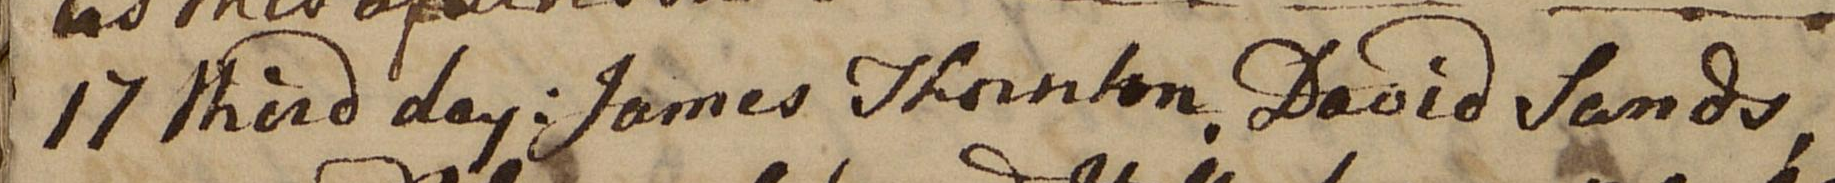17 third day: James Thornton, David Sands
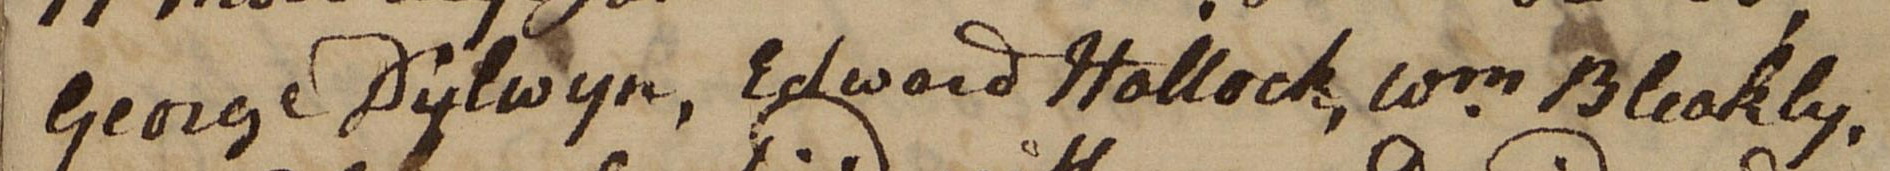George Dylwyn, Edward Hollock, W^m. Bleakly,
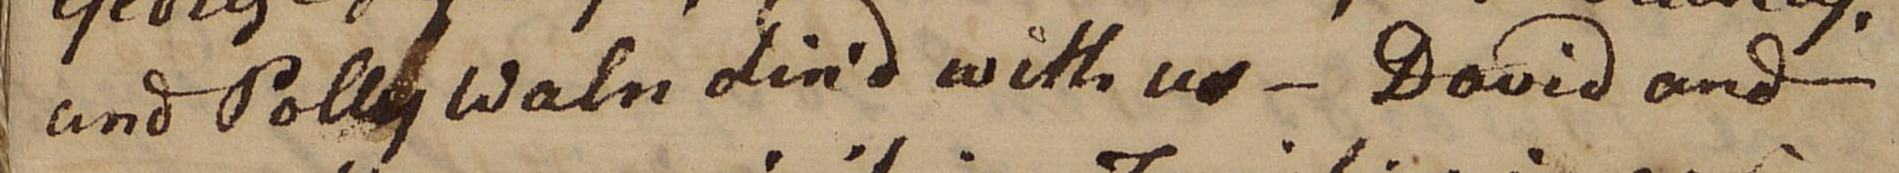and Pollly Waln din'd with us- David and
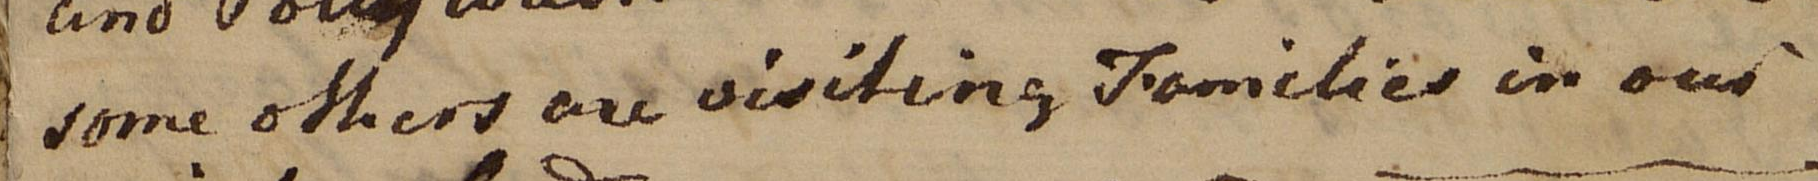some others are visiting Families in our
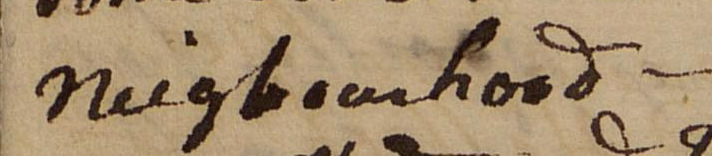Neigbourhood-
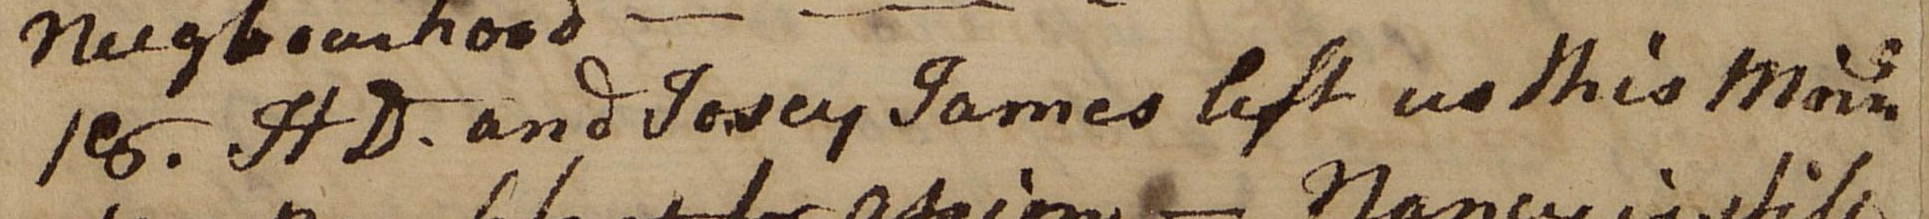18. HD. and Josey James left us this Morn^g
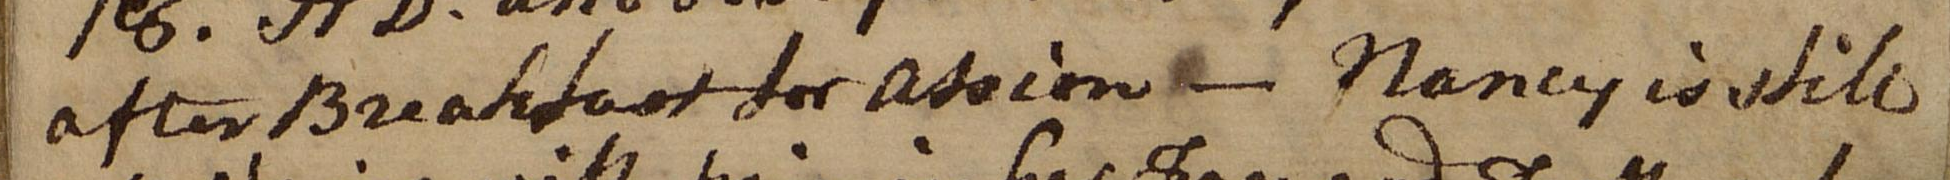after Breakfast for Assion- Nancy is still
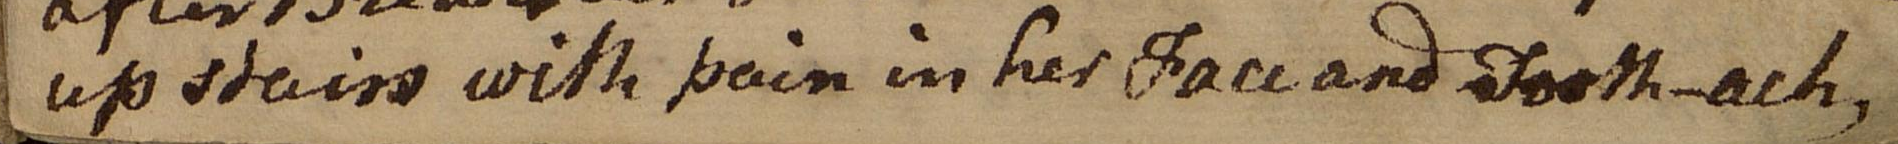up stairs with pain in her Face and Tooth-ach,
